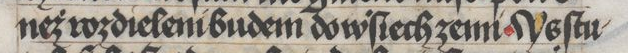neż rozdieleni budem do wẛiech zemí.Ysſtu¬
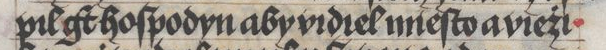pil ḡt hoſpodyn aby vidiel mieſto a vieżi.
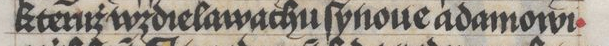kteruż wzdielawachu ſynoue adamowi.
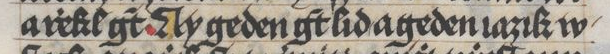a ṙekl ḡt.Ay geden ḡt lid a geden iazik w¬
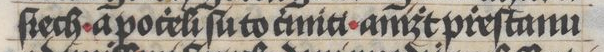ſiech.a poċeli ſu to ċiniti.aníżt pṙeſtanu
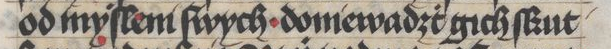od myẛlení ſwych.doniewadżt gich ſkut¬
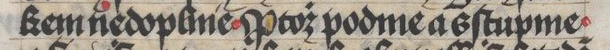kem nedoplnie.Ꝓtoż podme a sſtupme.
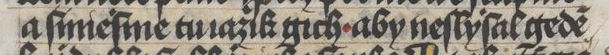a ſmieẛnie tu iazik gich.aby neſlyẛal gedē
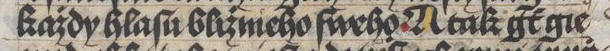każdy hlaſu bliżníeho ſweho. A tak ḡt gie
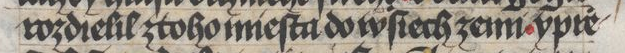rozdielil ztoho mieſta do wẛiech zemi.y pṙe¬
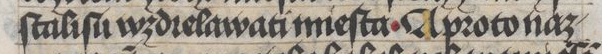ſtaliſu wżdielawati mieſta.A proto naz¬
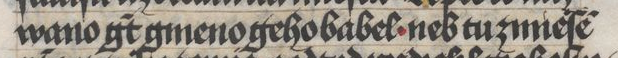wano ḡt gmeno geho babel.neb tu zmieẛē
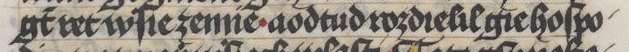ḡt ret wẛie zemie.a odtud rozdielil gie hoſpo¬
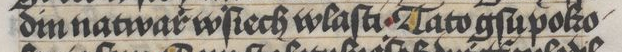din natwaṙ wẛiech wlaſtí.Tato gſu poko¬
